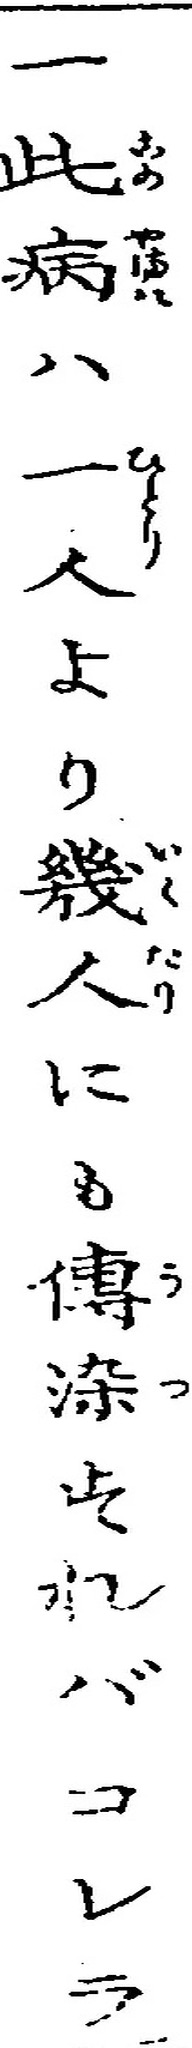一此病は一人より幾人にも傳染すればコレラ
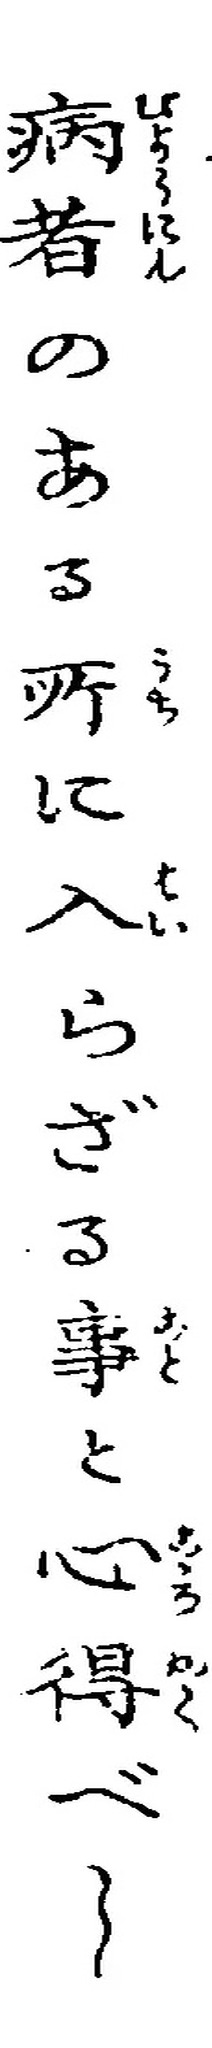病人のある所に入らざる事と心得べし
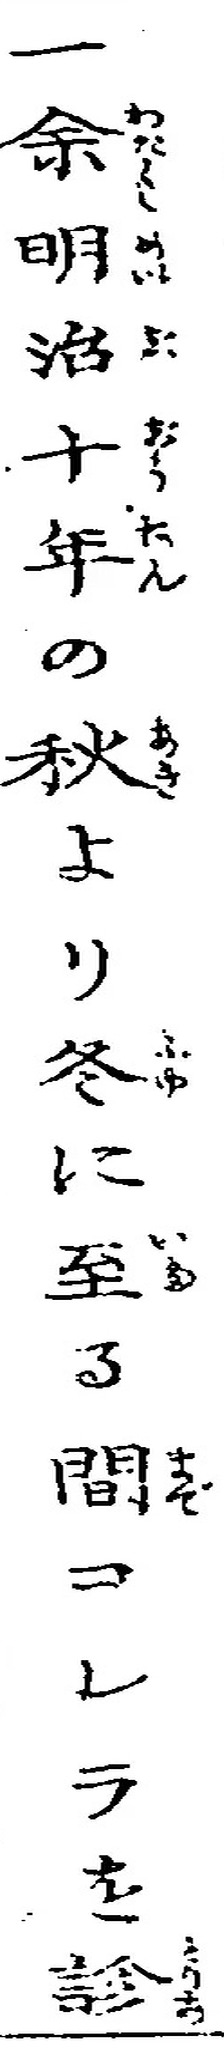一余明治十年の秋より冬に至る間コレラを診
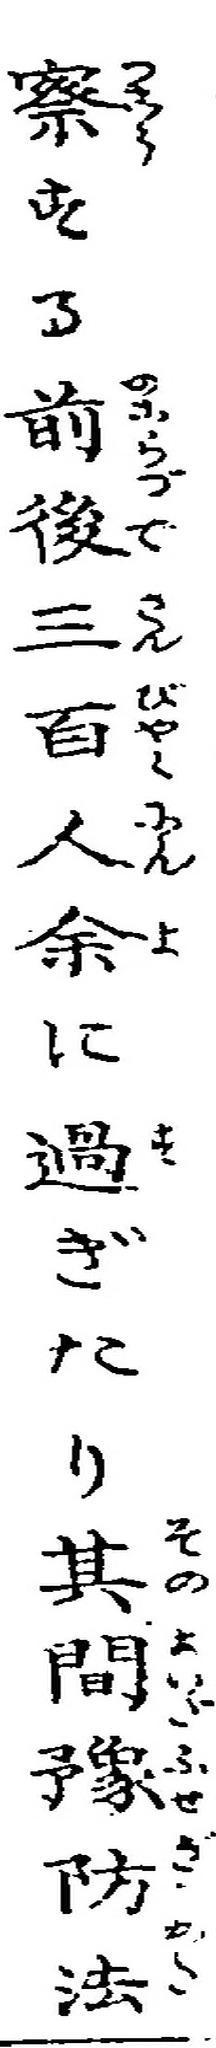察する前後三百人余に過ぎたり其間豫防法
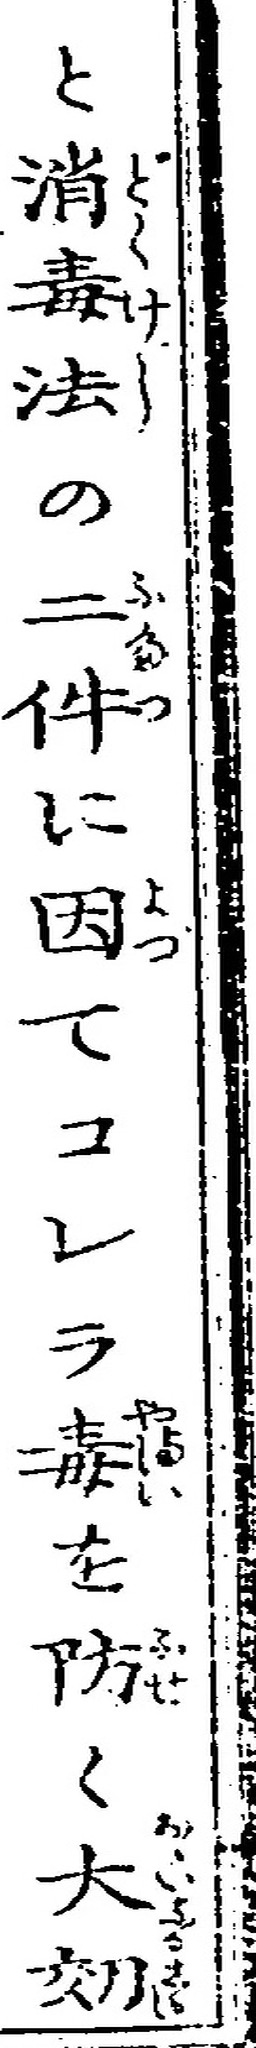と消毒法の二件に因てコレラ毒を防く大効
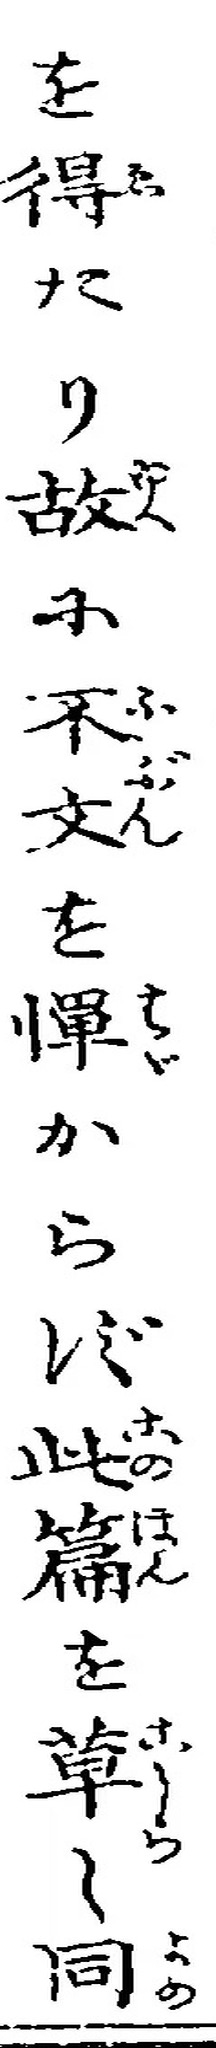を得たり故に不文を憚からず此篇を草し同
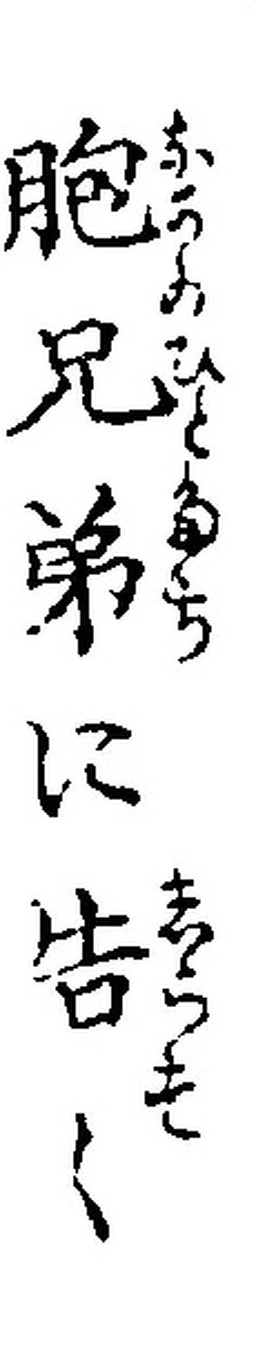胞兄弟に告く
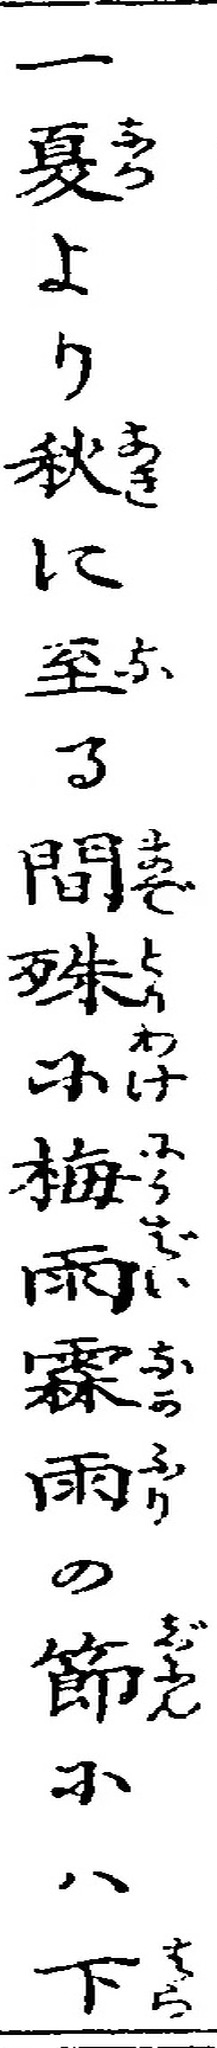一夏より秋に至る間殊に梅雨霖雨の節には下
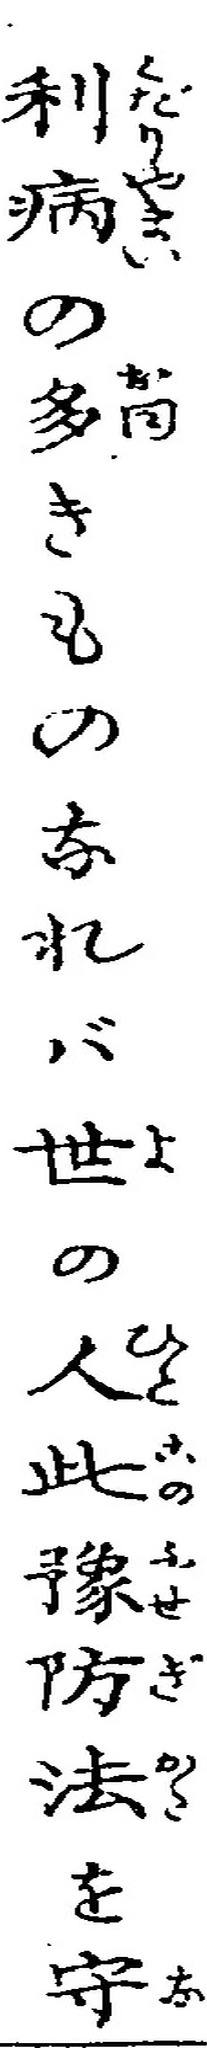利病の多きものなれば世の人此豫防法を守
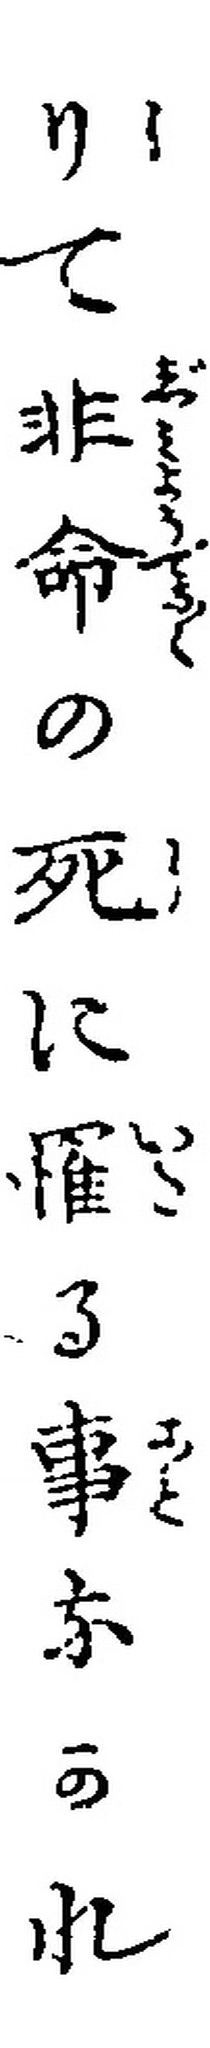りて非命の死に罹る事なかれ
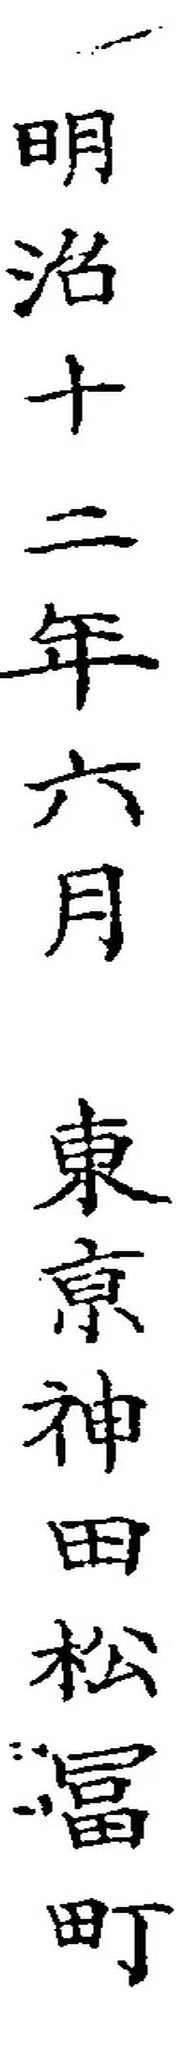明治十二年六月東京神田松冨町
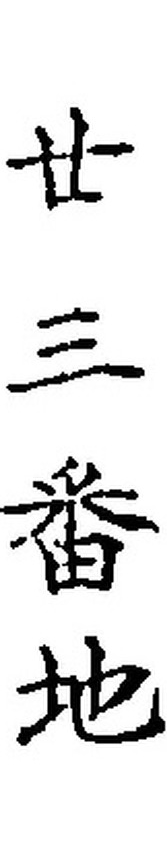廿三番地
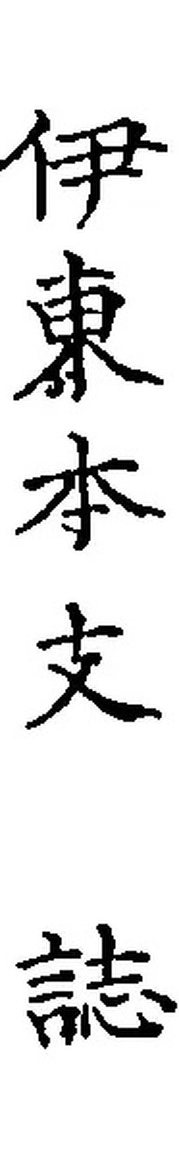伊東本支誌

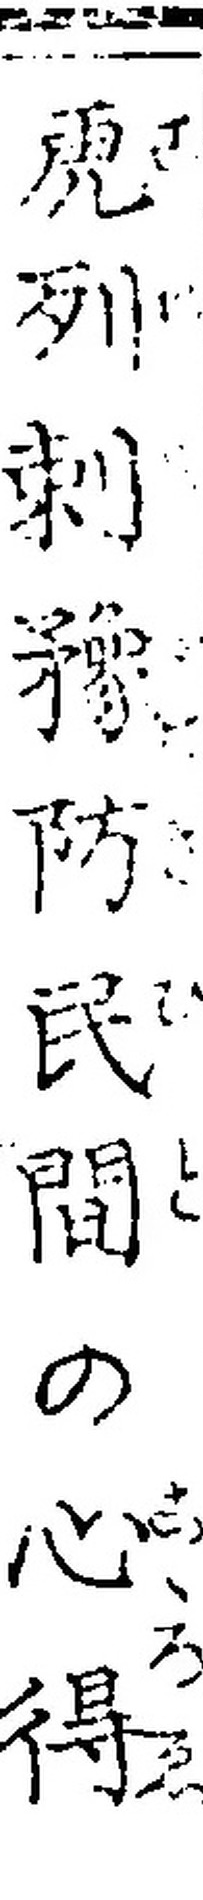虎列刺予防民間の心得
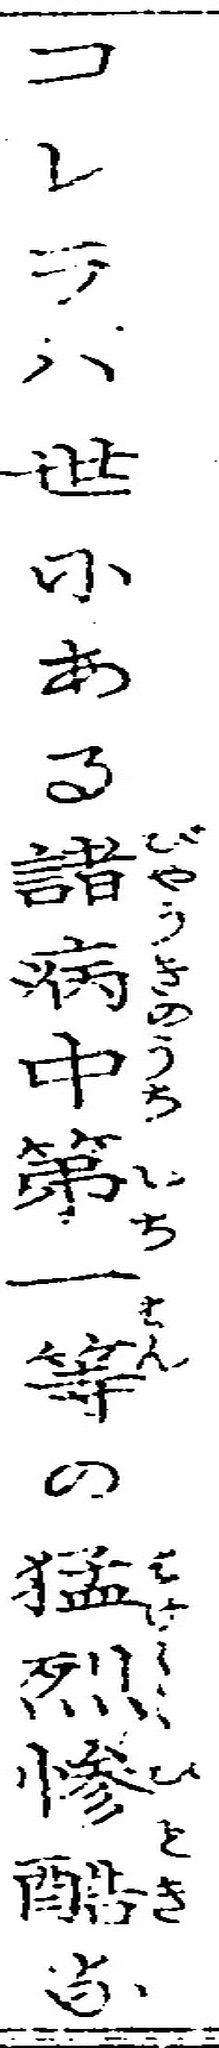コレラは世にある諸病中第一等の猛烈惨酷な
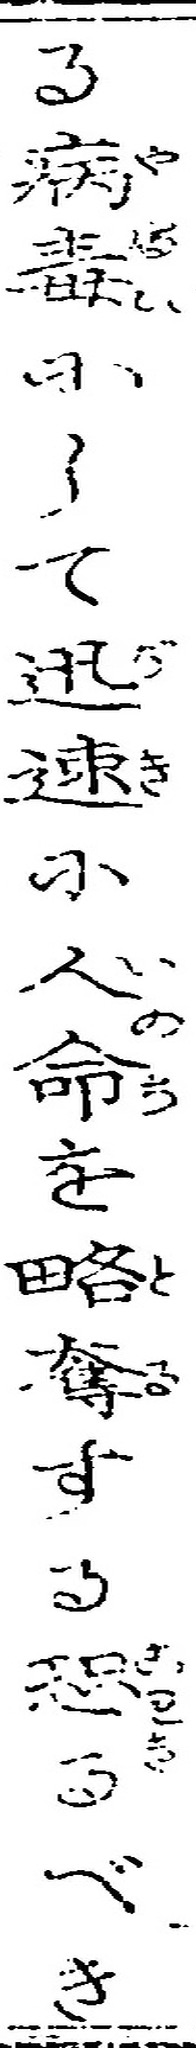る病毒にして迅速に人命を略奪する恐るべき
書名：虎列剌予防民間の心得
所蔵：国立国会図書館 National Diet Library, JAPAN
